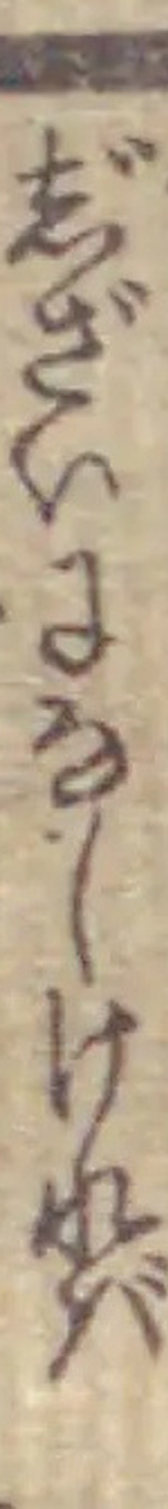じざいになしければ
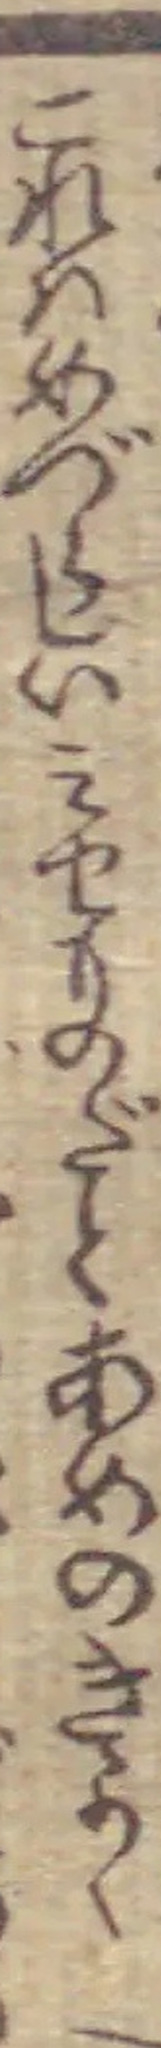これはめづらしいみせものだとあめのきよく
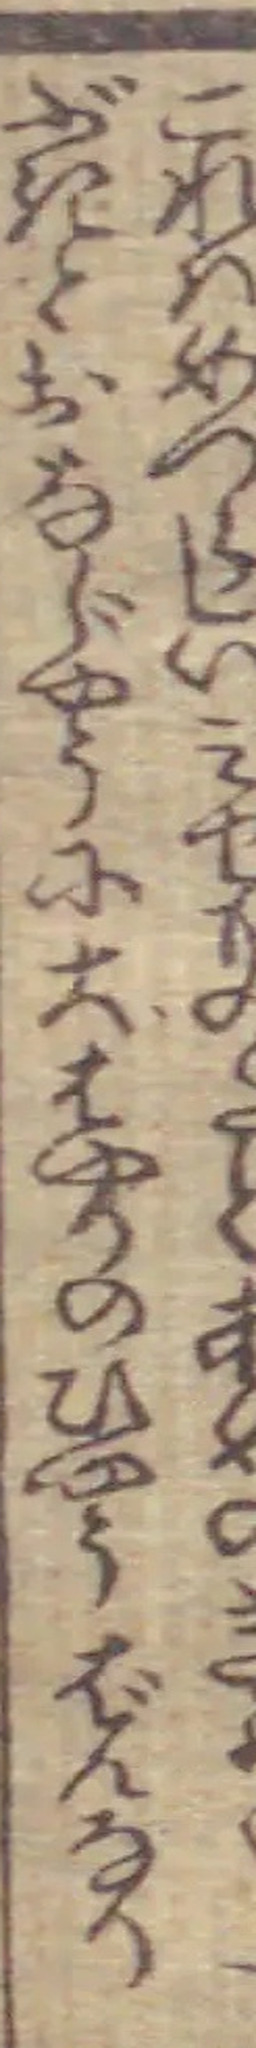ぶきだとおなじやうに大はやりのひやうばんなり

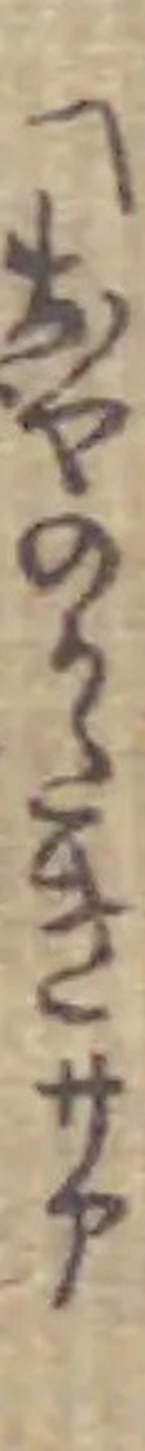〽おやのかたきサア
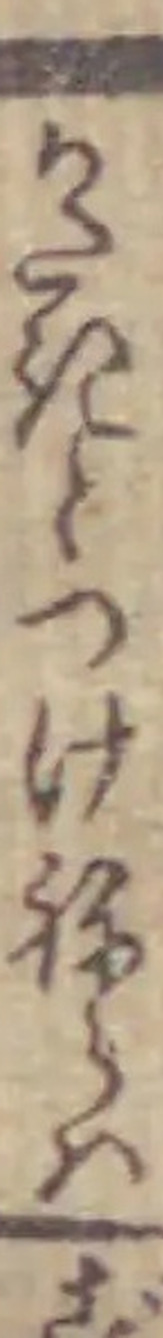かたきとつけねらはず
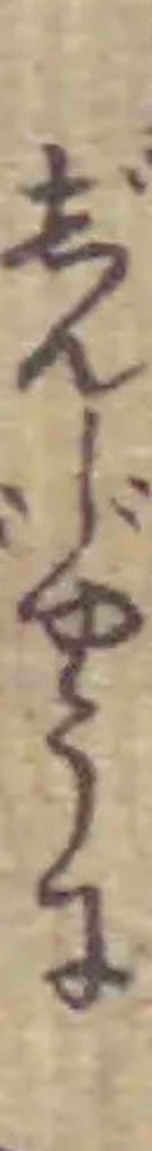じんじやうに
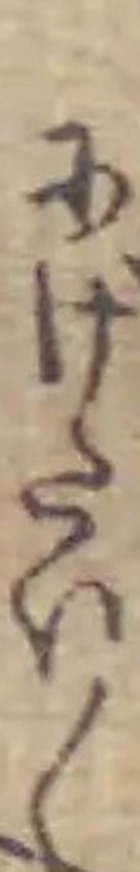にげたい〳〵
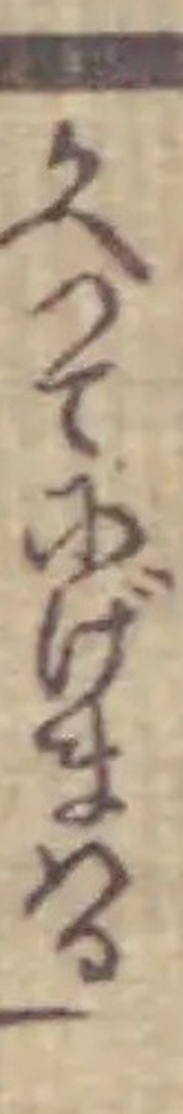かへつてにげまはる
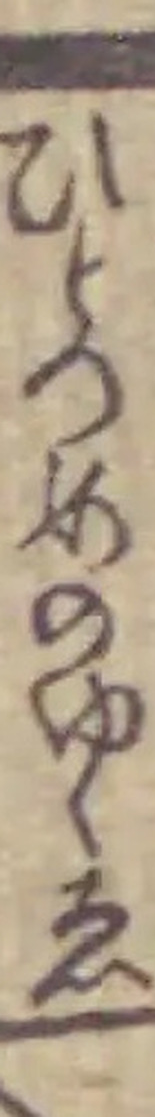ひとつめのゆくゑ
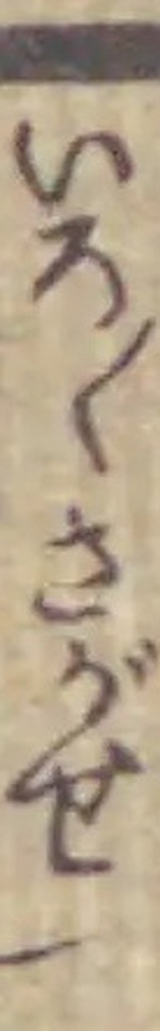いろ〳〵さがせ
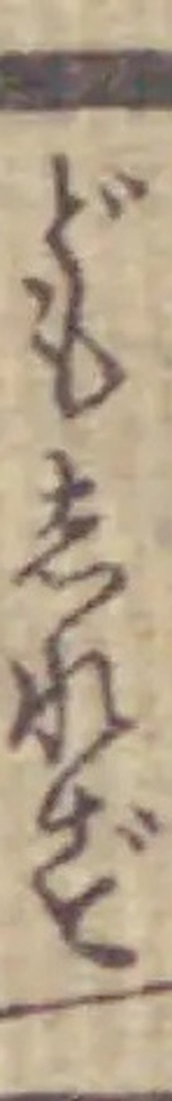どもしれず
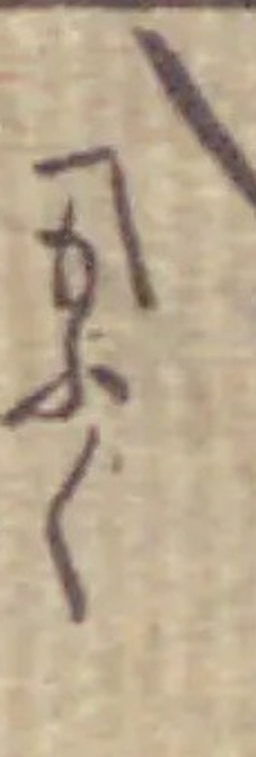〽もふ〳〵
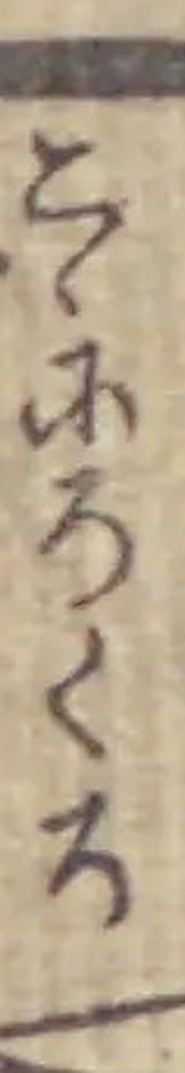こゝにろくろ
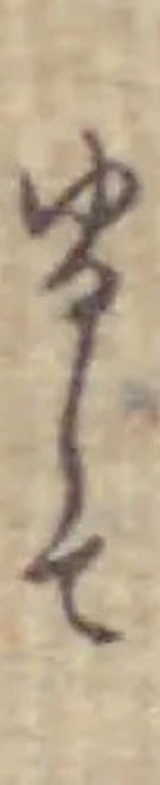ゆるして
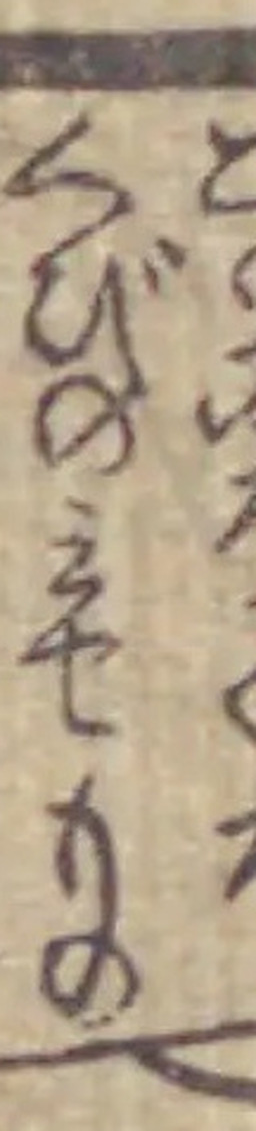くびのみせもの
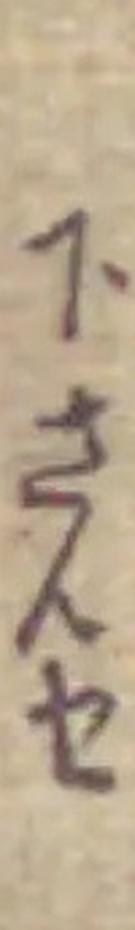下さんせ
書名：化物敵討 2巻
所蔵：国立国会図書館 National Diet Library, JAPAN
